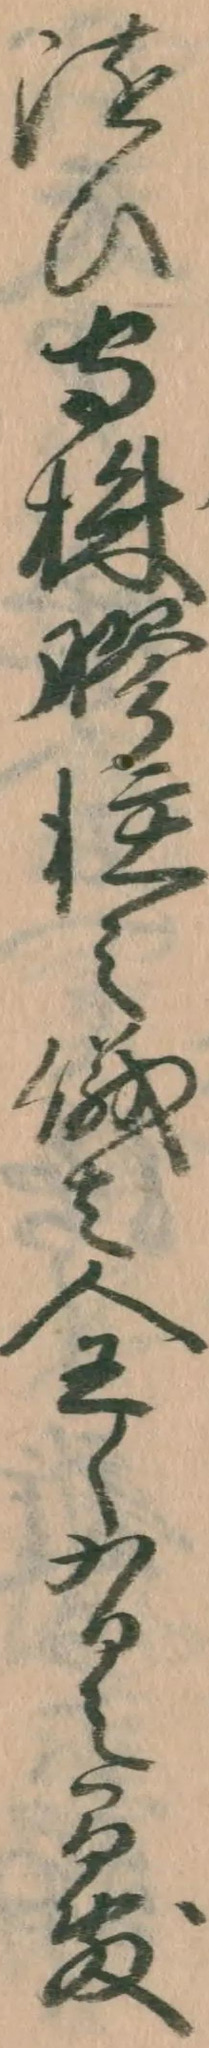随ひ守株膠柱之儀者全く有之間敷
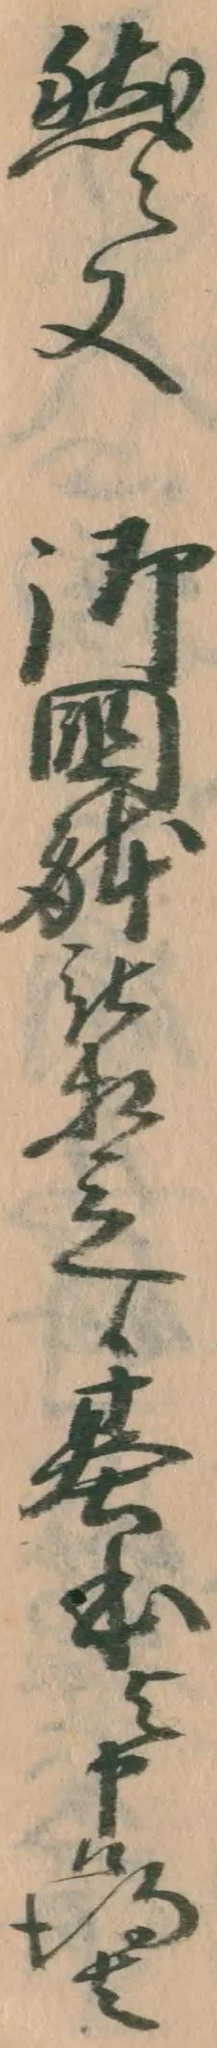然ニ又御国躰被相立候基本と申候得者
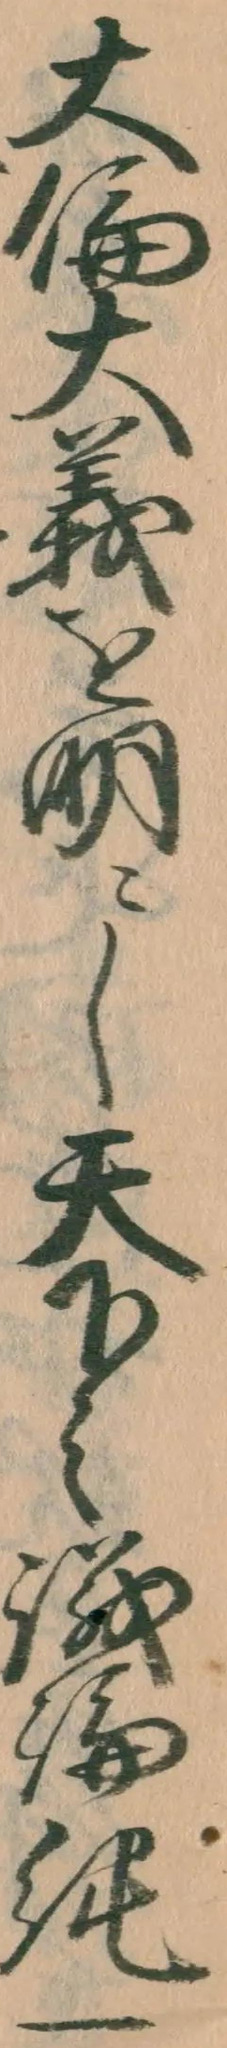大論大義を明ニし天下之議論純一
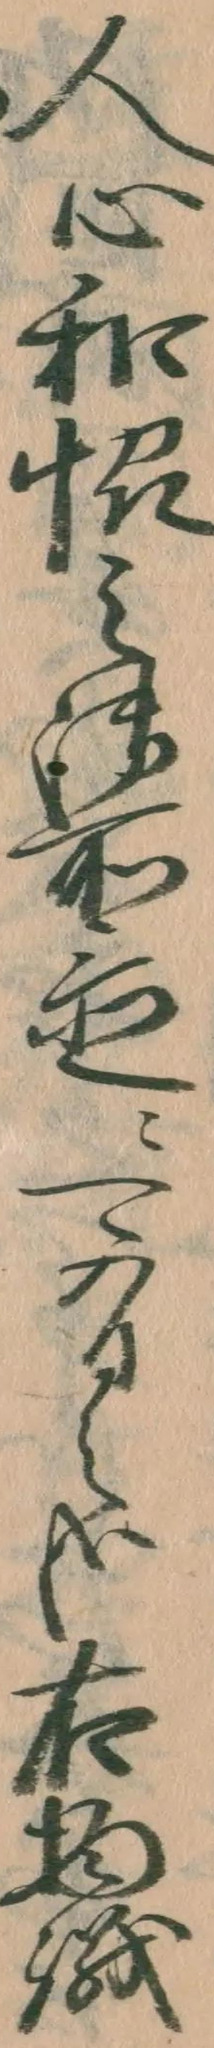人心和協之御所置ニ有之哉右物議
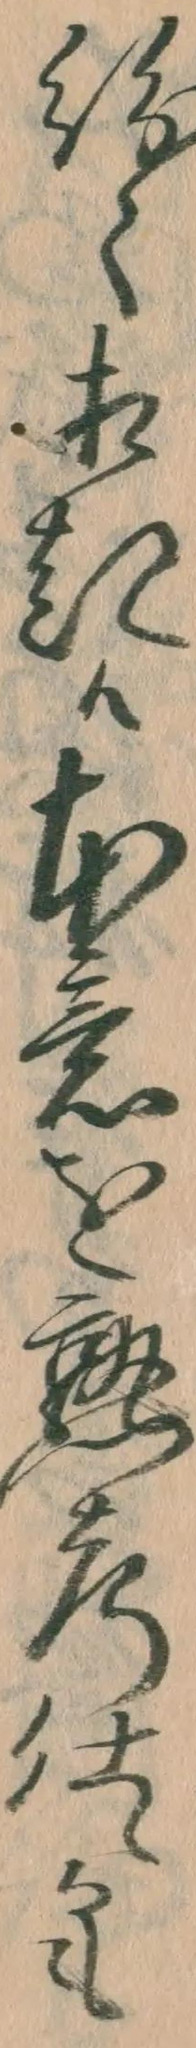紛々相起候本意を熟考仕候而も
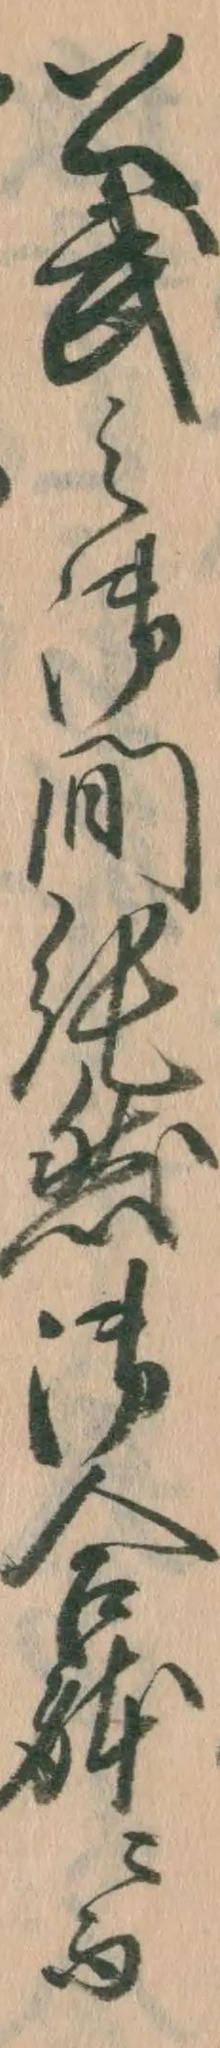公武之御間純然御合躰ニ而
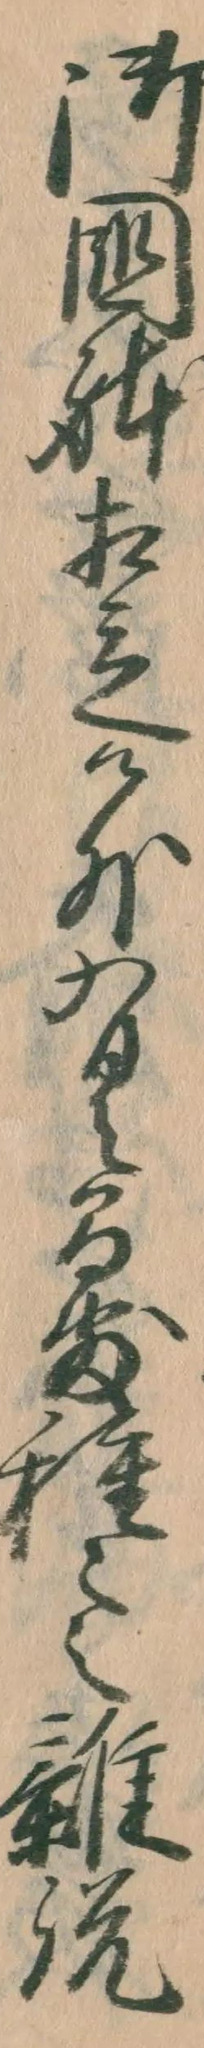御国躰相立候外有之間敷種ゝ之雑説
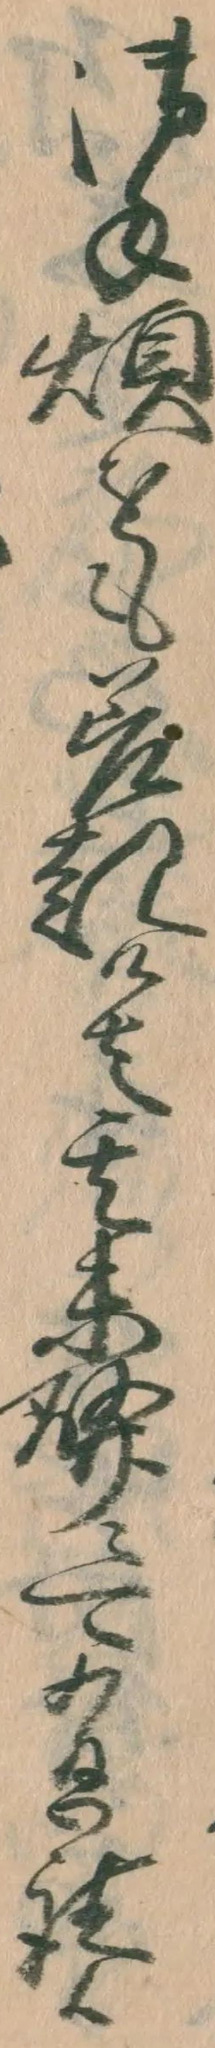御手煩をも差起候者其未聊ニ可有御座候
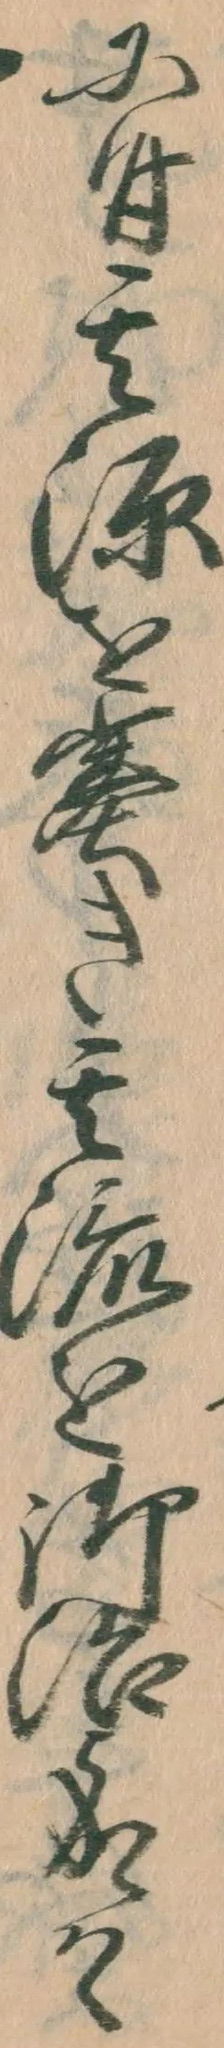に付其源を塞き其流を治被成候て
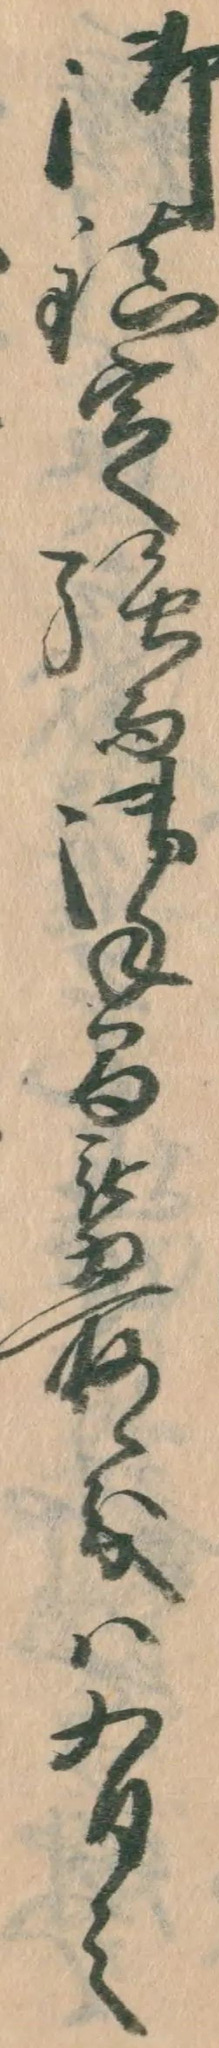御鎮定強て御手間被為取候義ハ有之
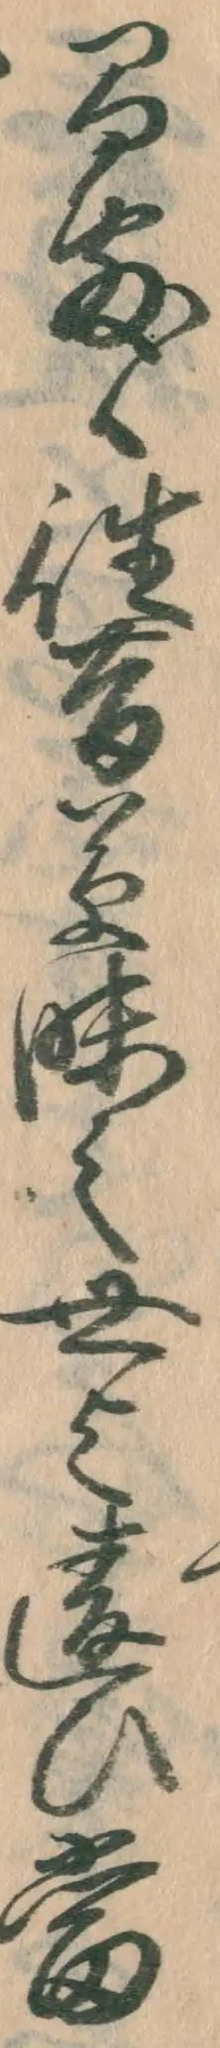間敷候往昔草昧之世と違ひ當
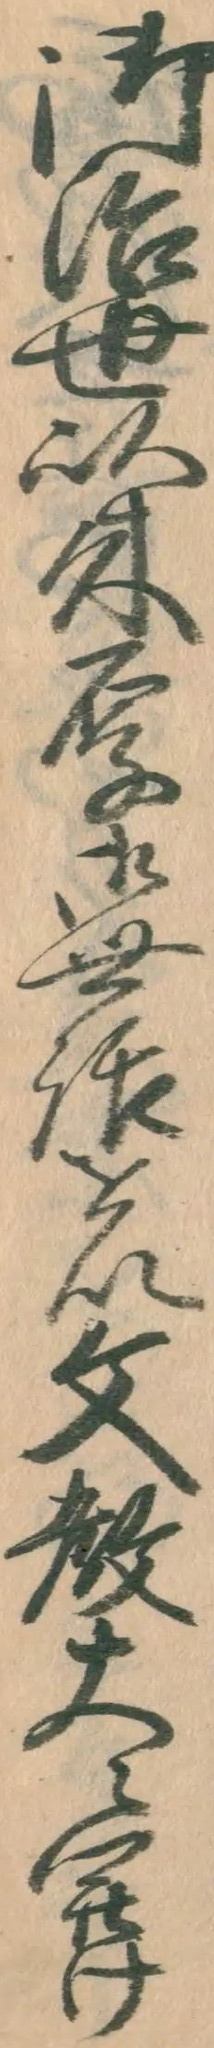御治世以来厚御世話を以文教大ニ開け

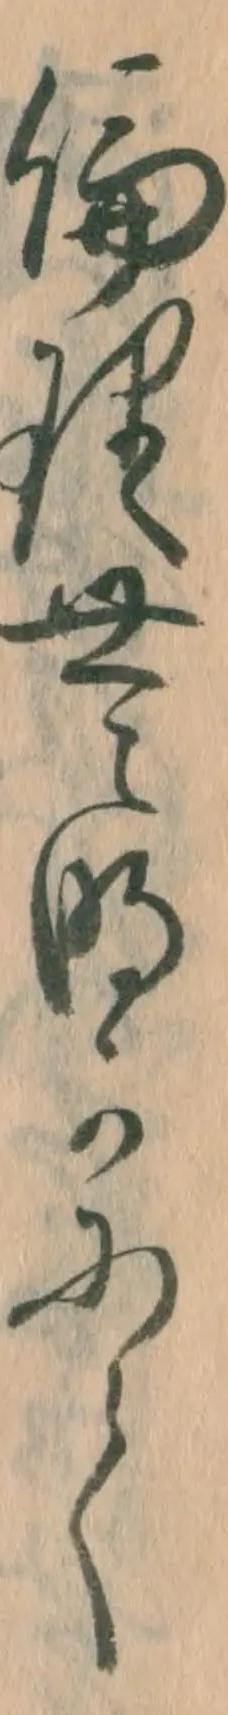論理世ニ明かにし
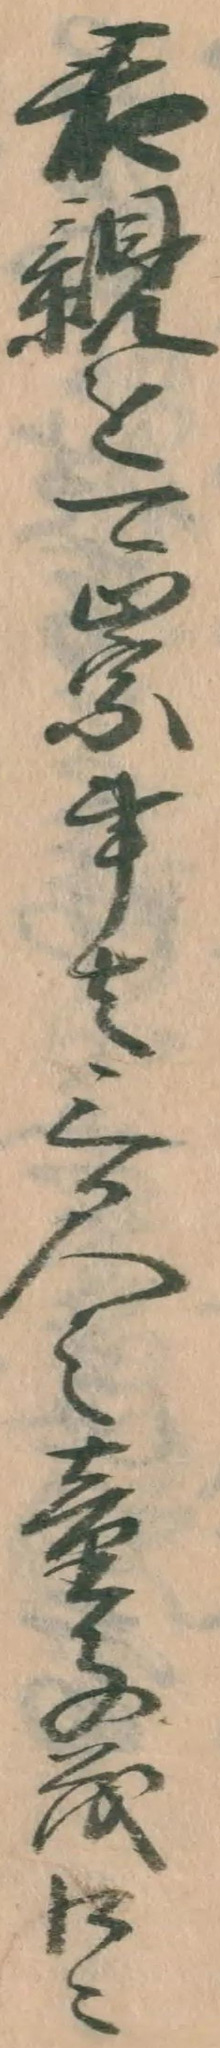君親を可崇事者三尺之童子も口二
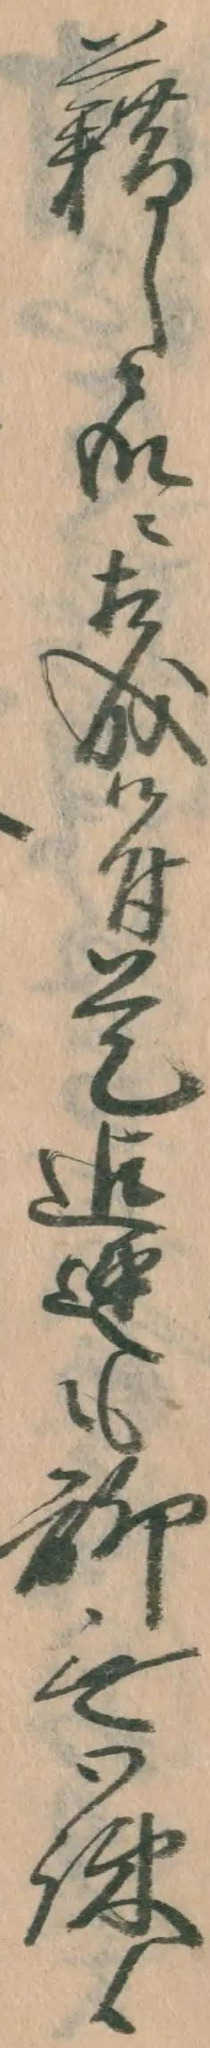藉し候処二相成候付是迄迚も聊無御疎候
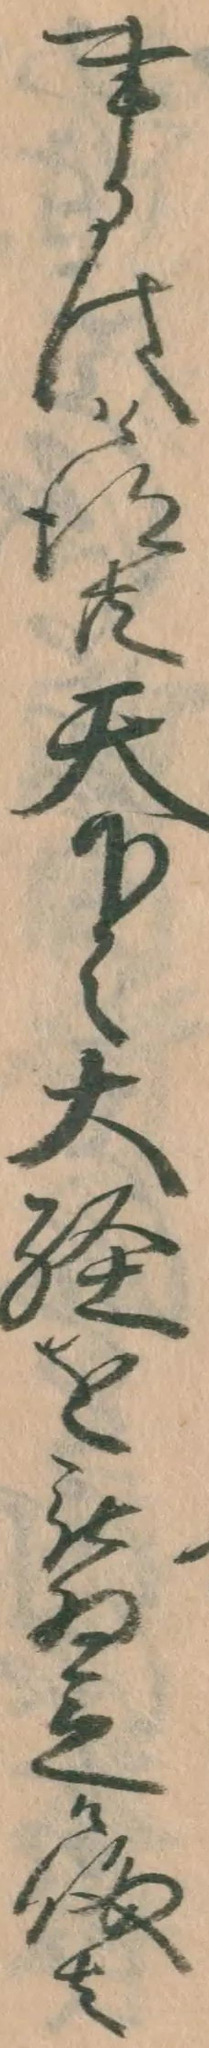事には候得共天下之大経を被為立候儀者
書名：麗斎叢書. 20
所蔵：国立国会図書館 National Diet Library, JAPAN
